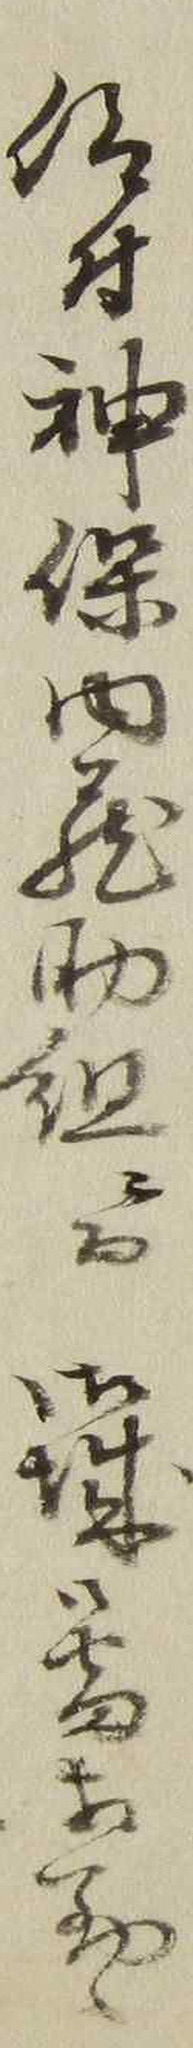仰付神保内蔵助組ニ而御城御番相勤候
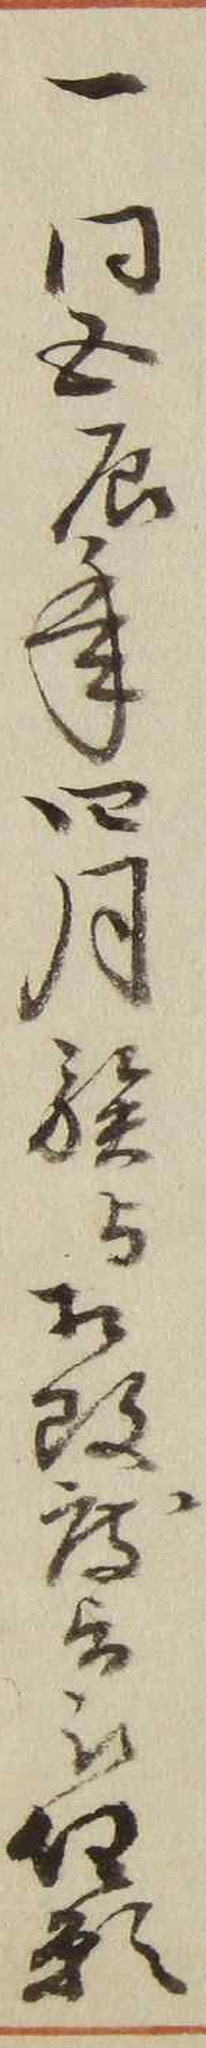一同五辰年四月族与相改度旨被任願

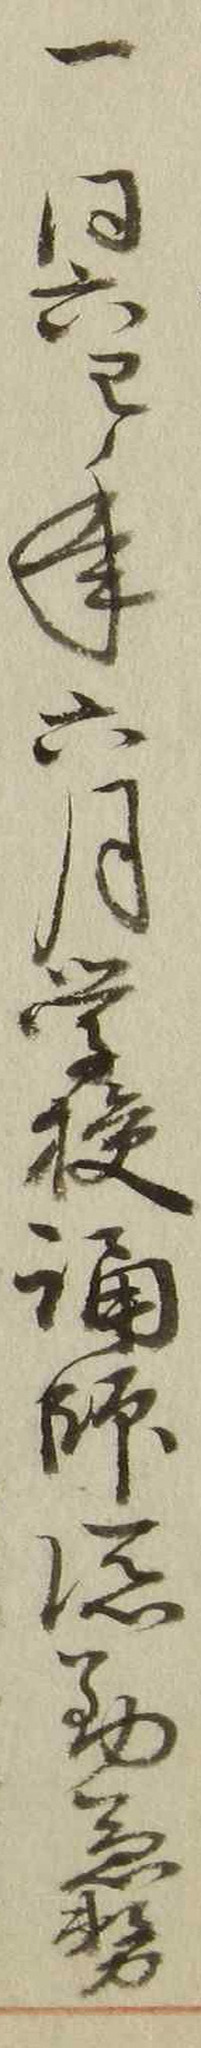一同六巳年六月学校誦師跡勤兼務
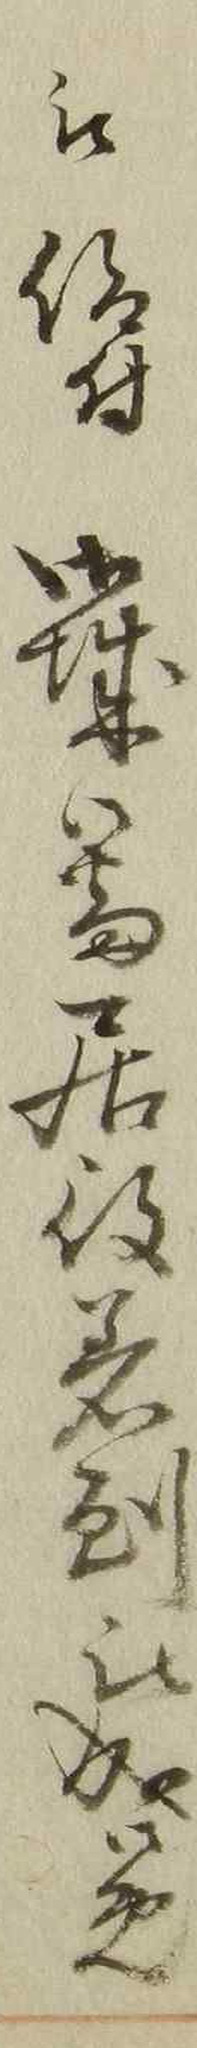被仰付御城御番居役着到被成御免
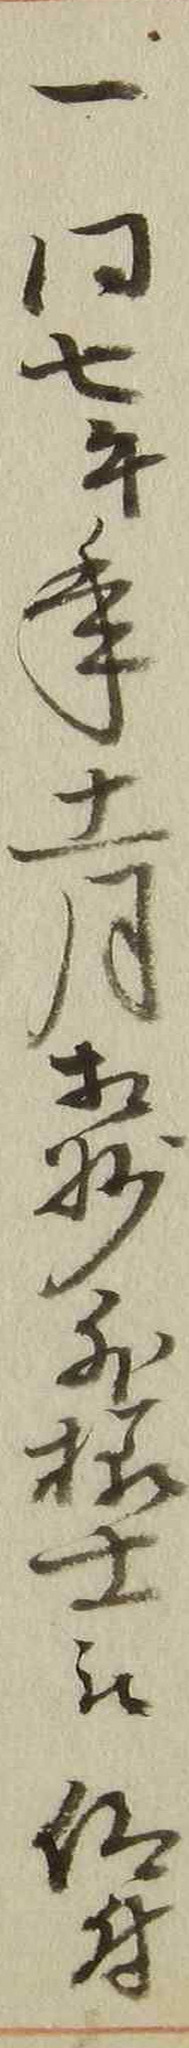一同七午年十一月相州外様士被仰付
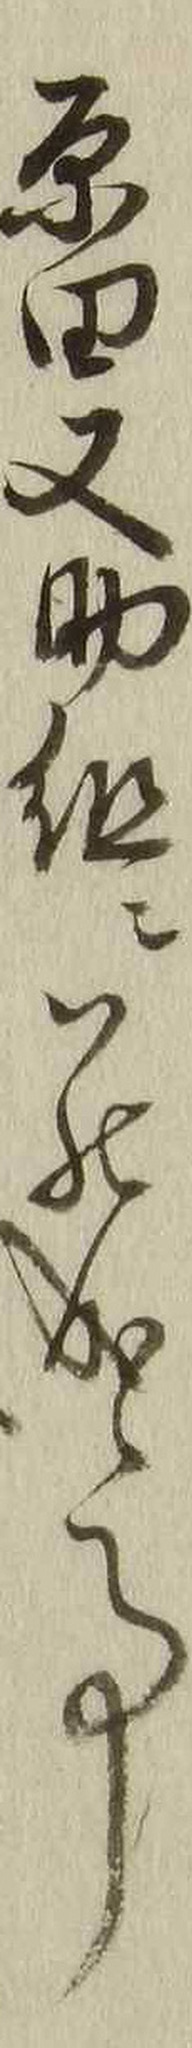原田又助組ニ罷成候事
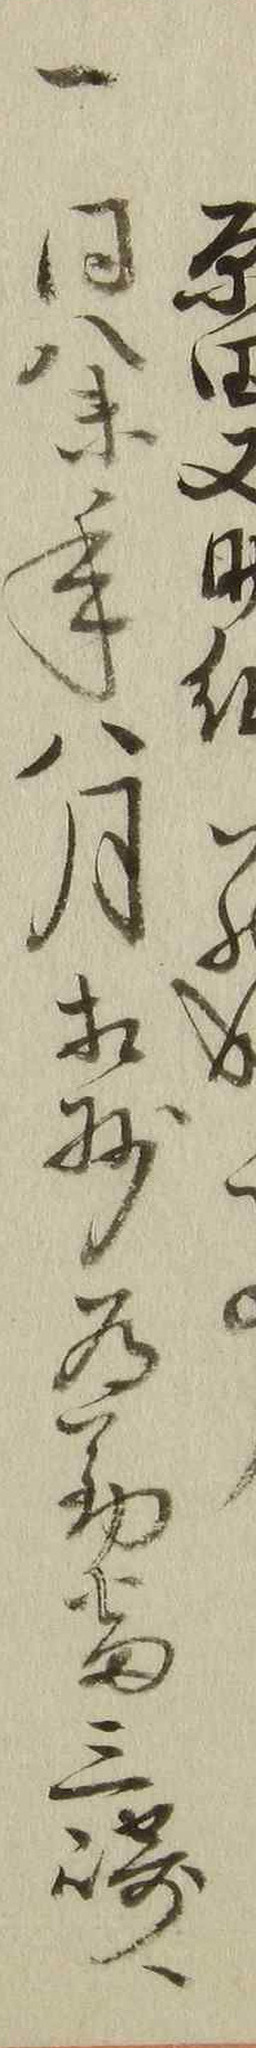一同八未八月相州常勤番三崎へ
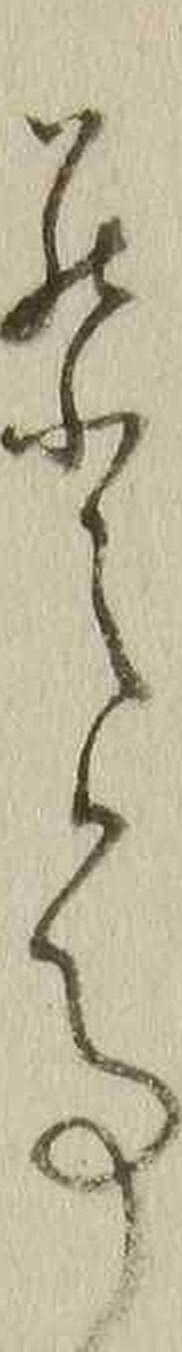罷登候事
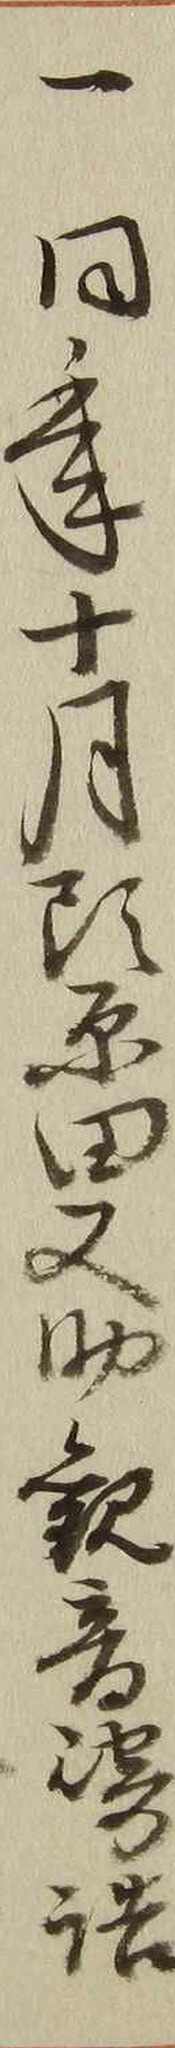一同年十月頭原田又助観音崎詰
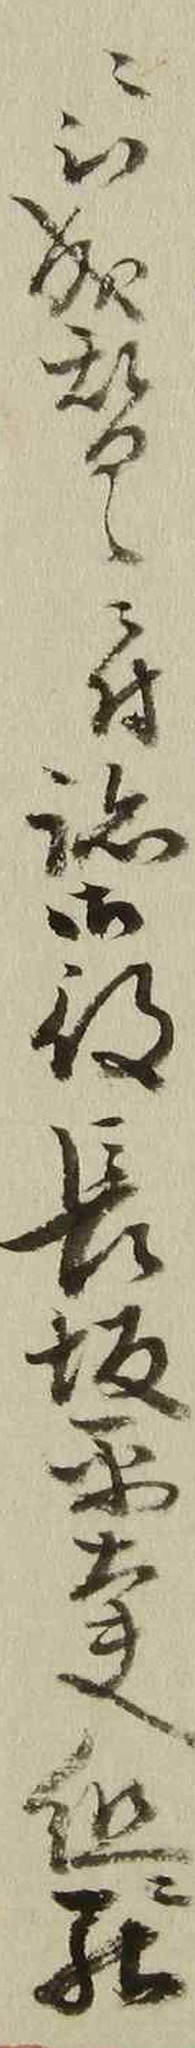ニ被成替候ニ付跡御役長坂平大夫組ニ罷
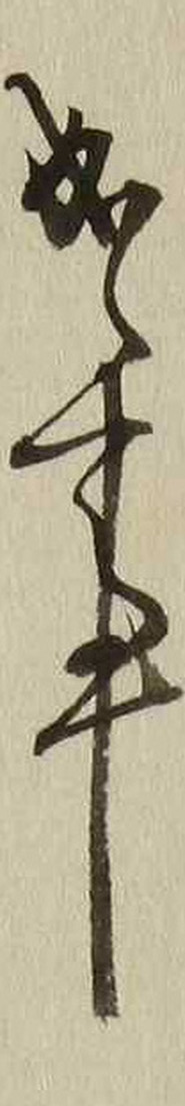成候事
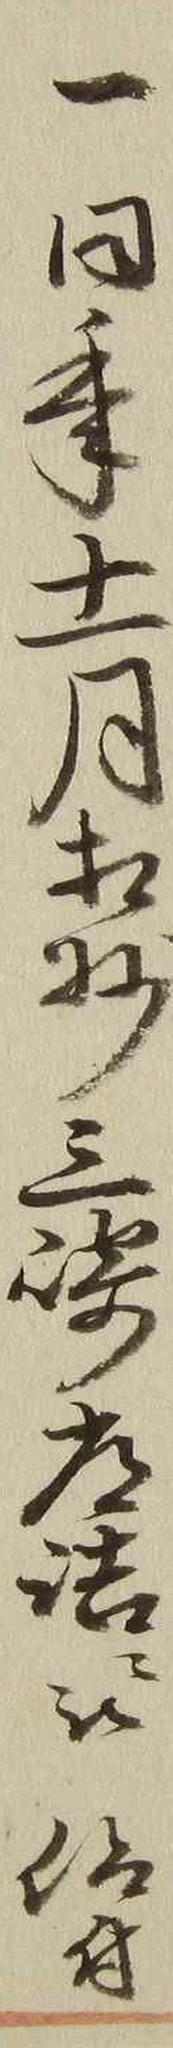一同年十一月相州三崎常詰ニ被仰付
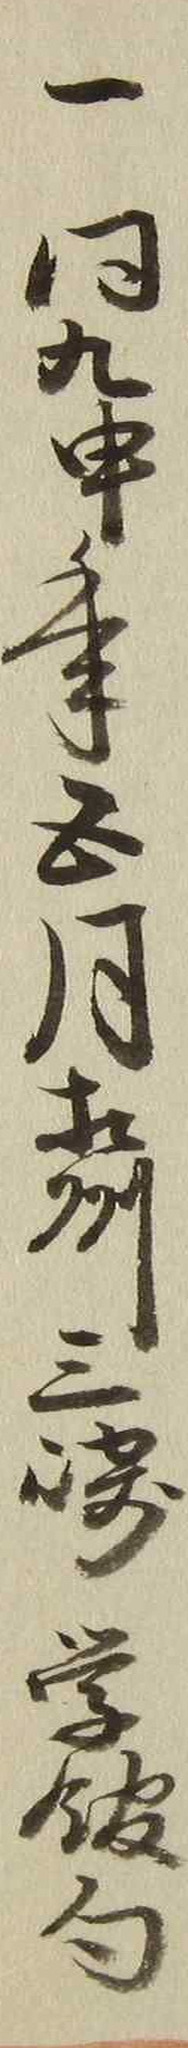一同九申年五月相州三崎学館句
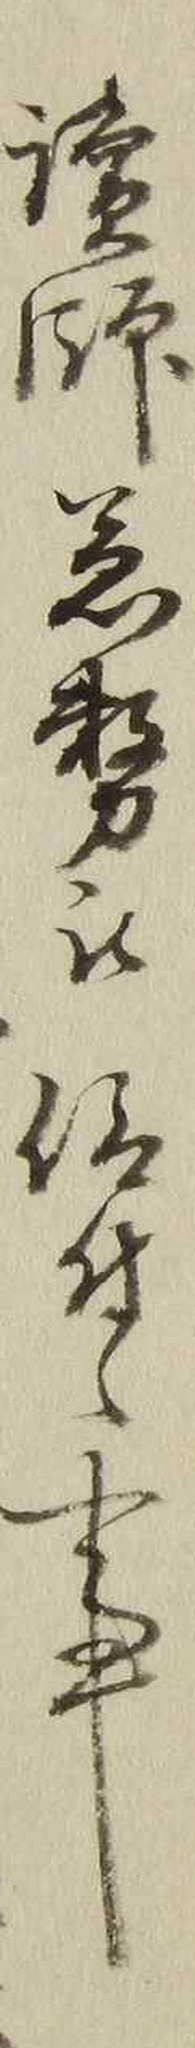読師兼務被仰付候事
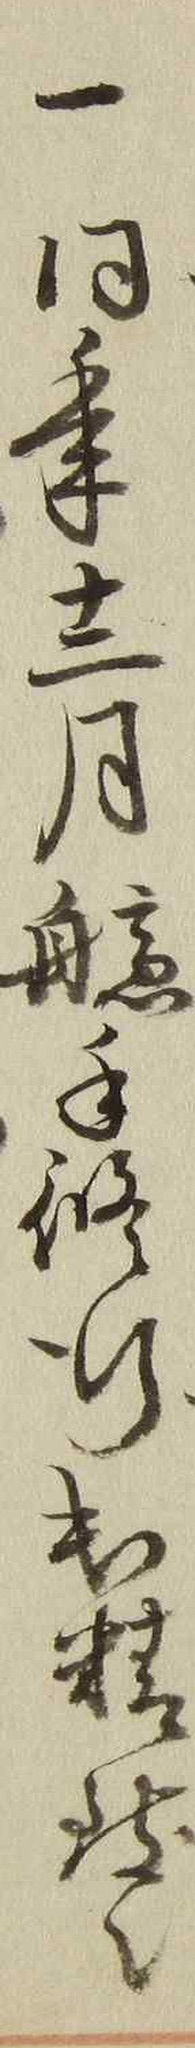一同年十二月艫手修行出精致候
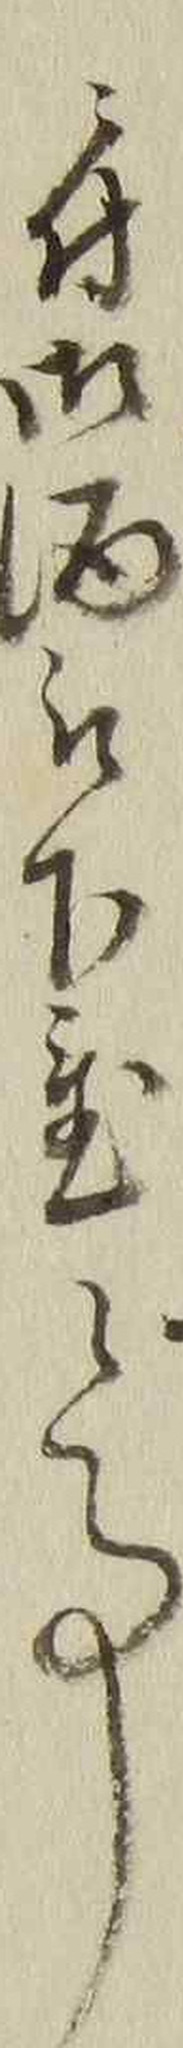ニ付御酒被下置候事
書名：諸士系譜　巻之53　に之部4
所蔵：会津若松市立会津図書館
